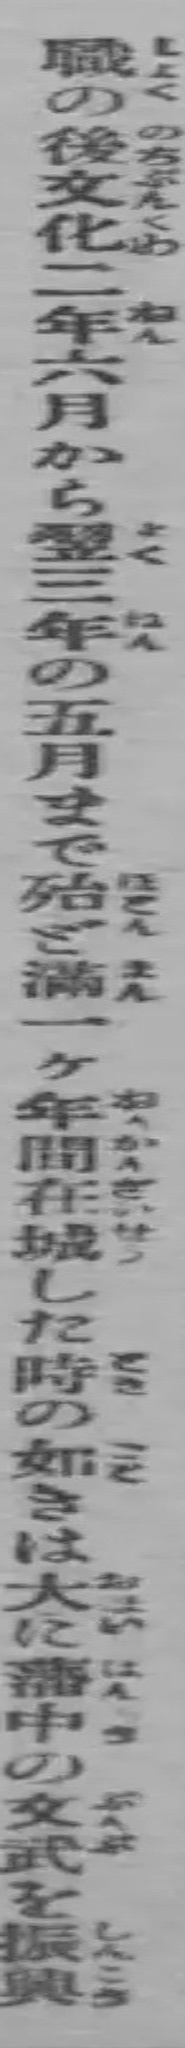職の後文化二年六月から翌三年の五月まで殆ど満一ケ年間在城した時の如きは大に藩中の文武を振興
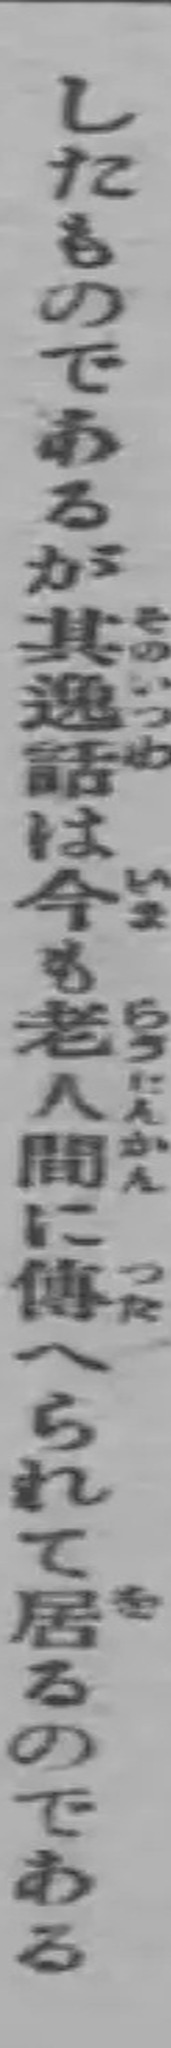したものであるが其逸話は今も老人間に伝へられて居るのである
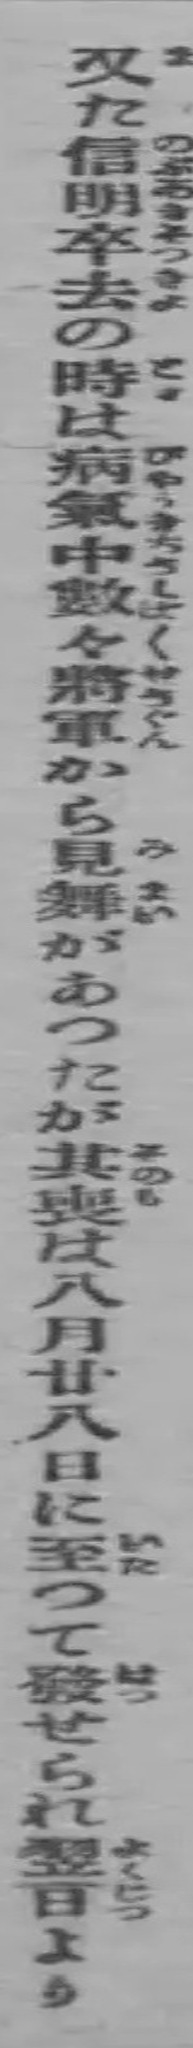信明の葬儀又た信明卒去の時は病気中数々将軍から見舞があつたが其喪は八月廿八日に至つて発せられ翌日より
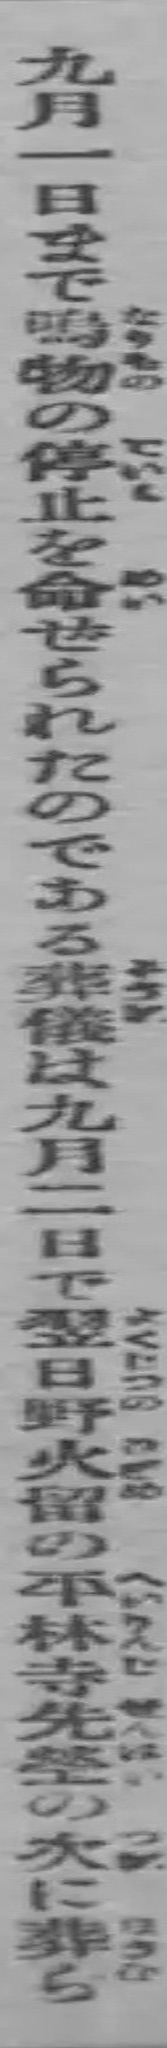九月一日まで鳴物の停止を命ぜられたのである葬儀は九月二日で翌日野火留の平林寺先塋の次に葬ら
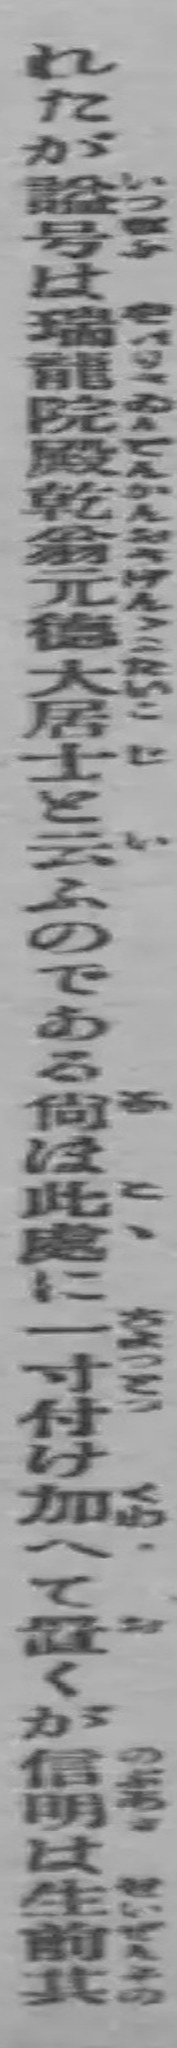れたが諡号は瑞龍院殿乾翁元徳大居士と云ふのである尚ほ此処に一寸付け加へて置くが信明は生前其
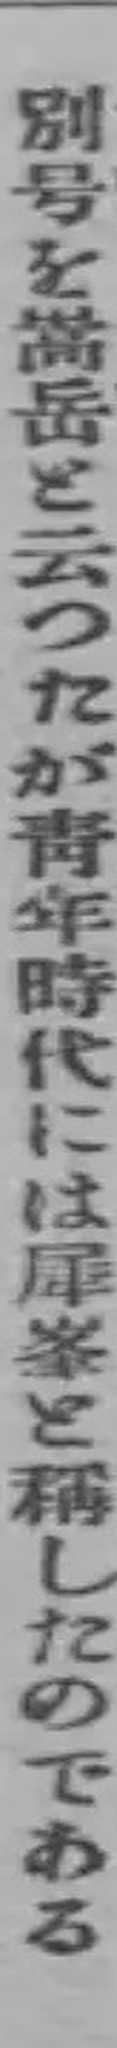別号を嵩岳と云つたが青年時代には犀峯と称したのである
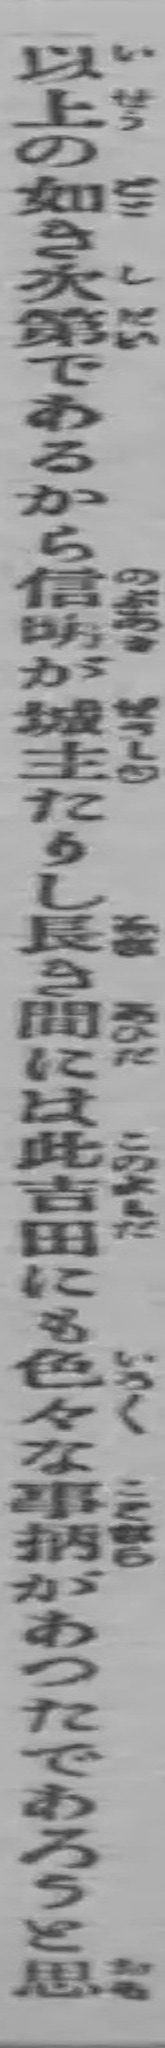以上の如き次第であるから信明が城主たりし長き間には此吉田にも色々な事柄があつたであろうと思
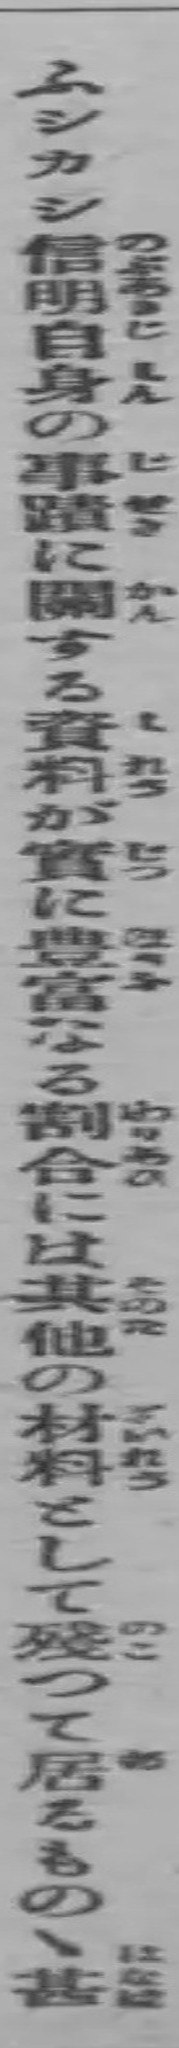ふシカシ信明自身の事蹟に関する資料が実に豊富なる割合には其他の材料として残つて居るものゝ甚
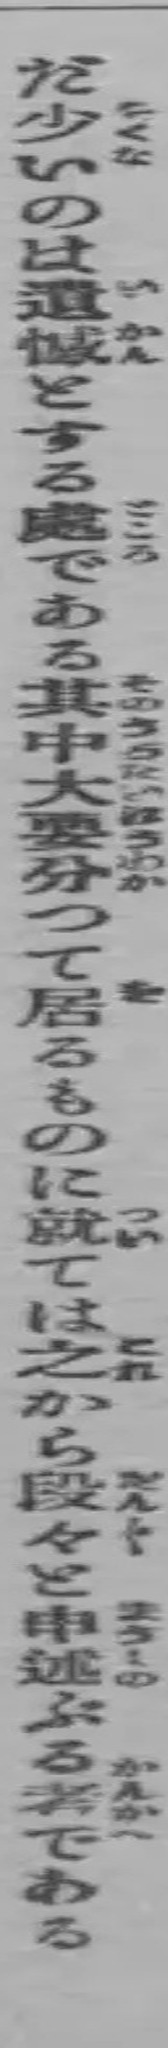だ少いのは遺憾とする処である其中大要分つて居るものに就ては之から段々と申述ぶる考である
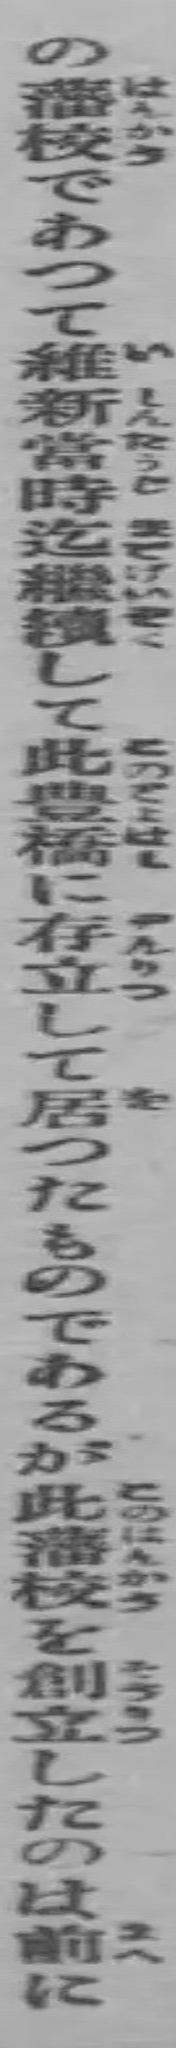の藩校であつて維新当時迄継続して此豊橋に存立して居つたものであるが此藩校を創立したのは前に
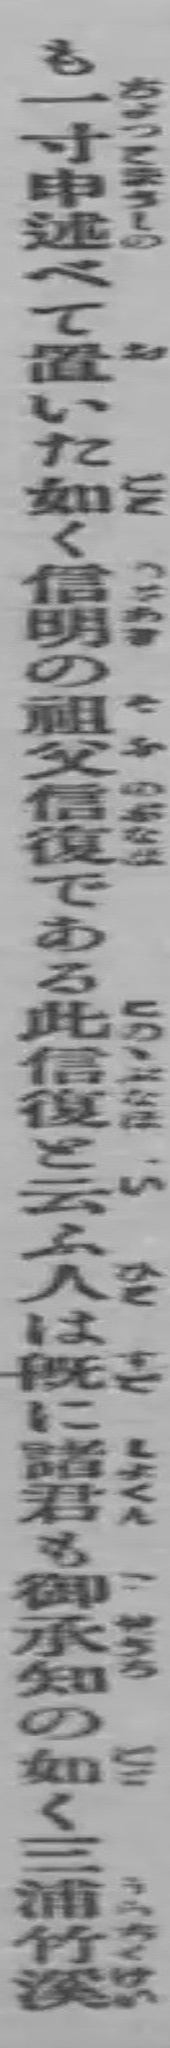も一寸申述べて置いた如く信明の祖父の信復である此信復と云ふ人は既に諸君も御承知の如く三浦竹渓
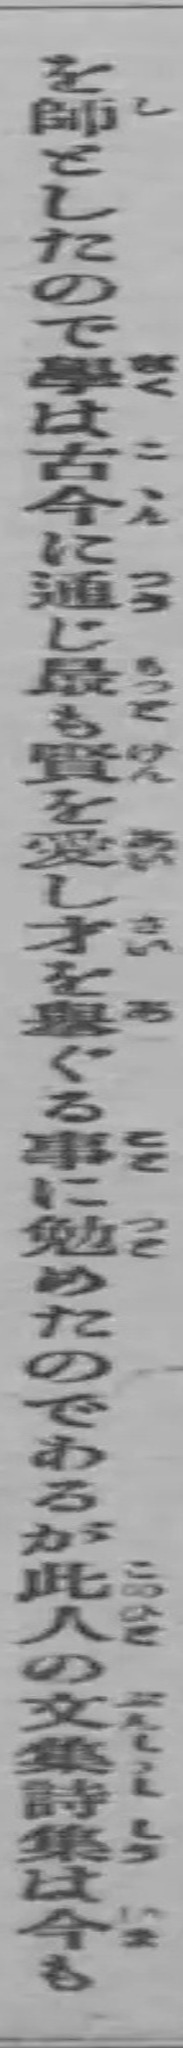を師としたので学は古今に通じ最も賢を愛し才を挙ぐる事に勉強めたのであるが此人の文集詩集は今も
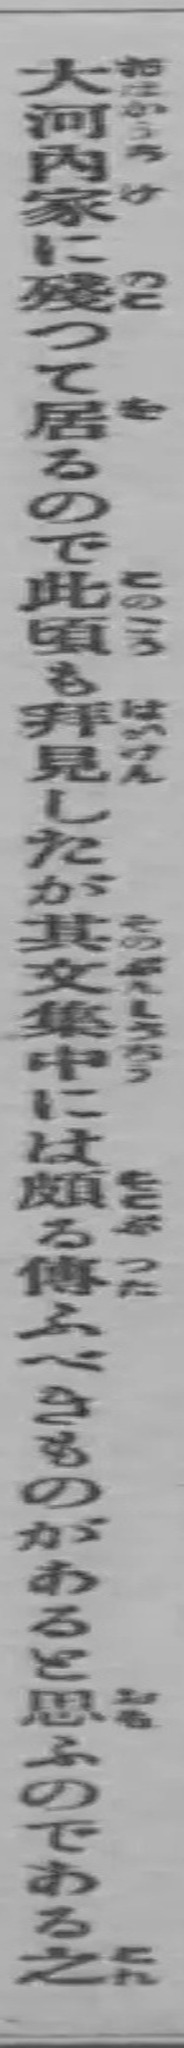大河内家に残つて居るので此頃も拝見したが其文集中には頗る伝ふべきものがあると思ふのである之
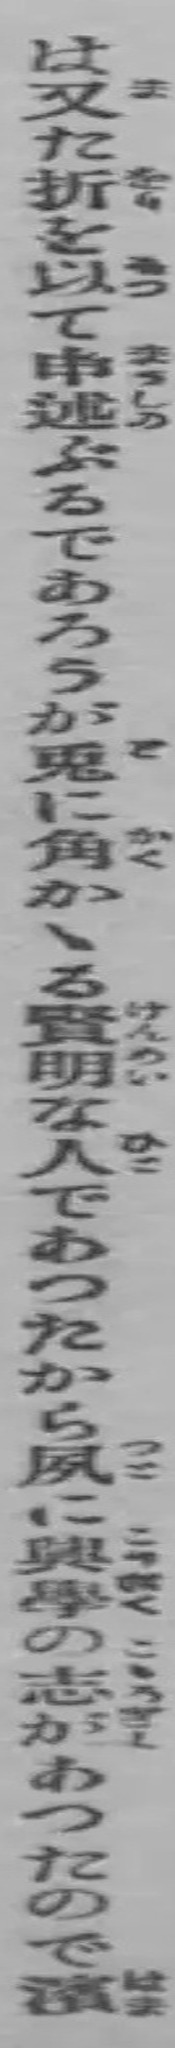は又た折を以て申述ぶるであろうが兎に角かゝる賢明な人であつたから夙に興学の志があつたので浜
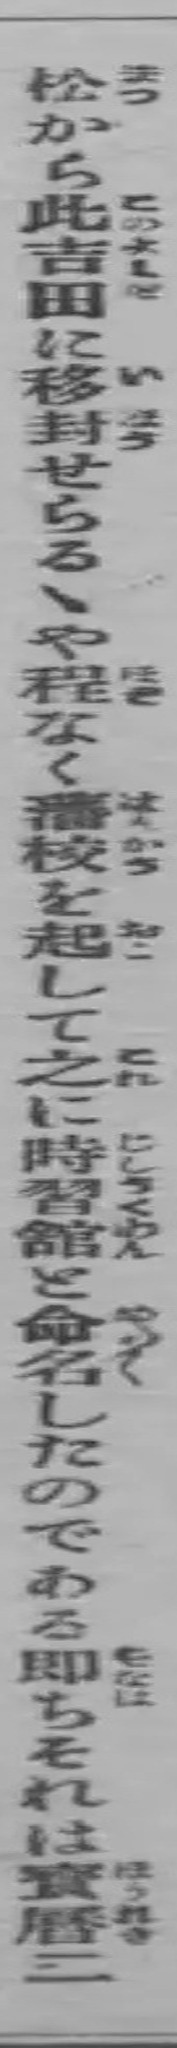松から此吉田に移封せらるゝや程なく藩校を起して之に時習館と命名したのである即ちそれは宝暦二
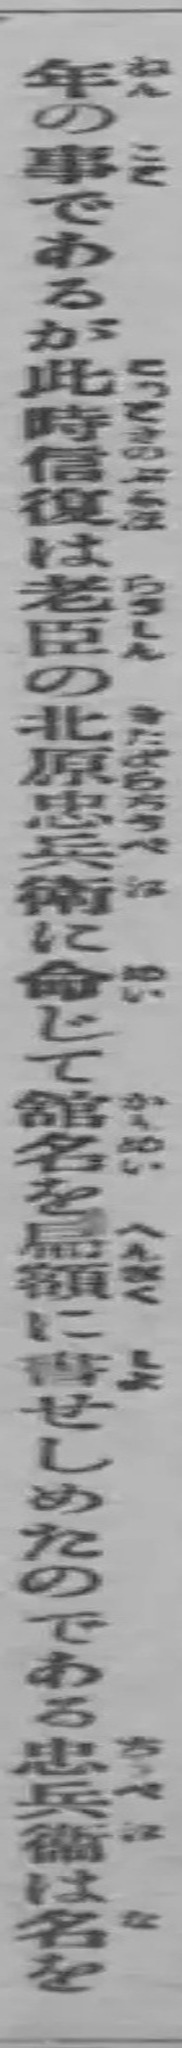年の事であるが此時信復は老臣の北原忠兵衛に命じて館名を扁額に書せしめたのである忠兵衛は名を
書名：豊橋市史談
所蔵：国立国会図書館 National Diet Library, JAPAN
